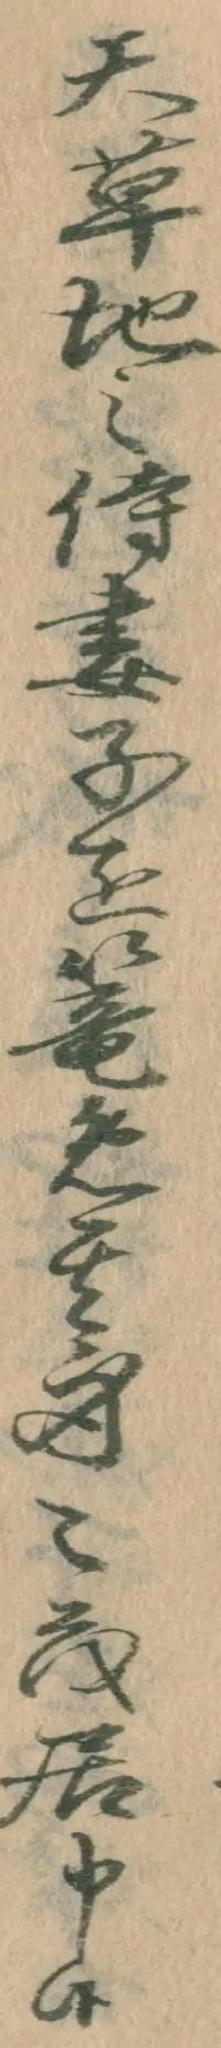天草地之侍妻子を篭め其身にも居申候
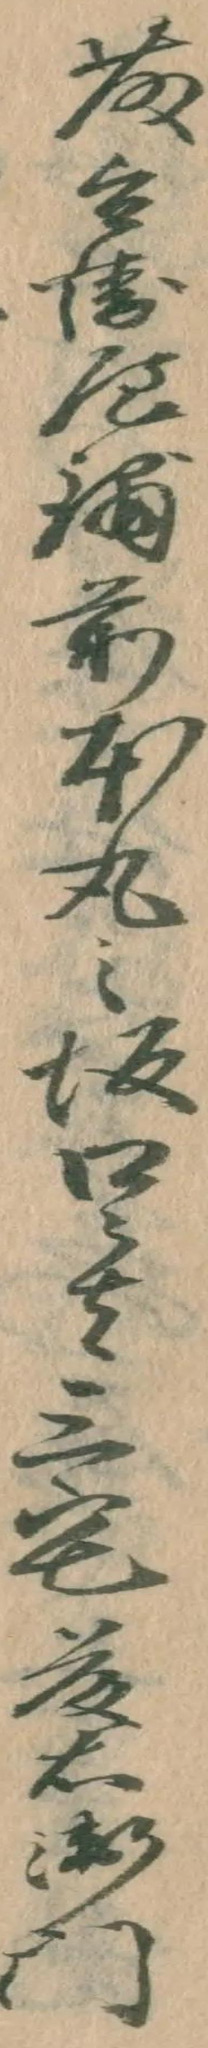藤兵衛屋鋪前本丸之坂口には三宅藤右衛門
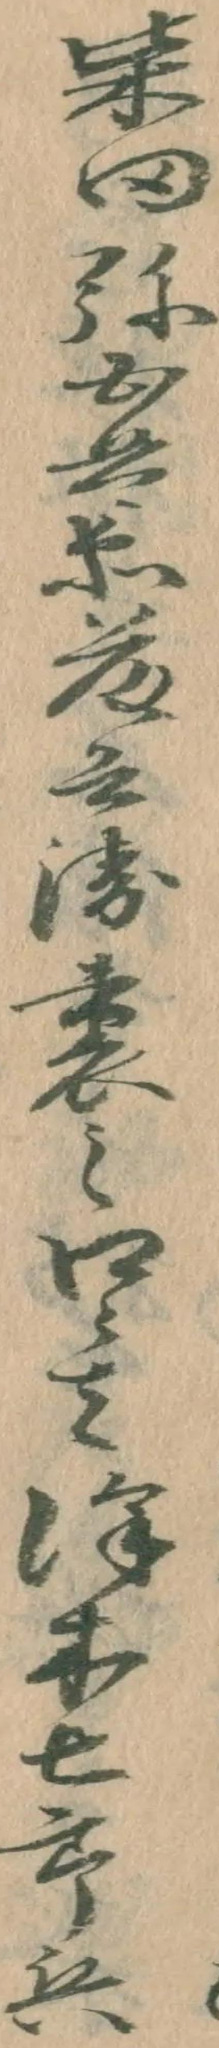柴田弥五兵衛藤兵衛裏之口には沢木七郎兵
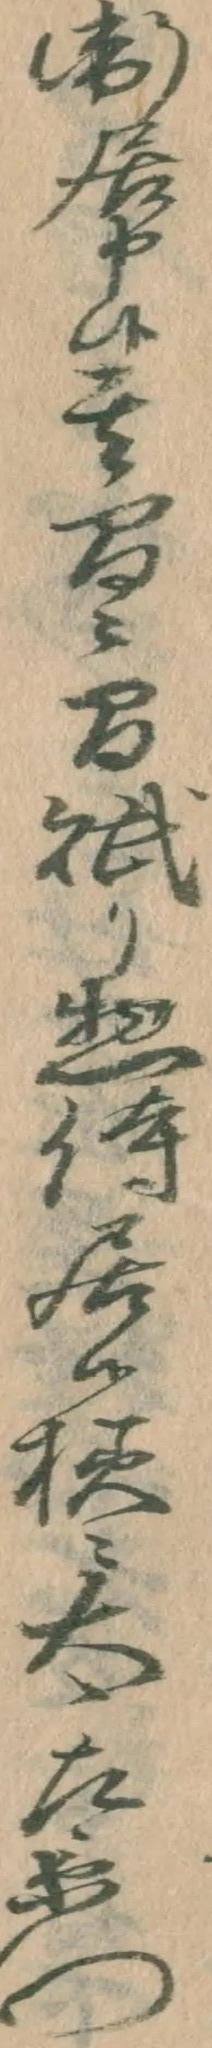衛居申候其間に間賦り惣侍居候様に太左衛門
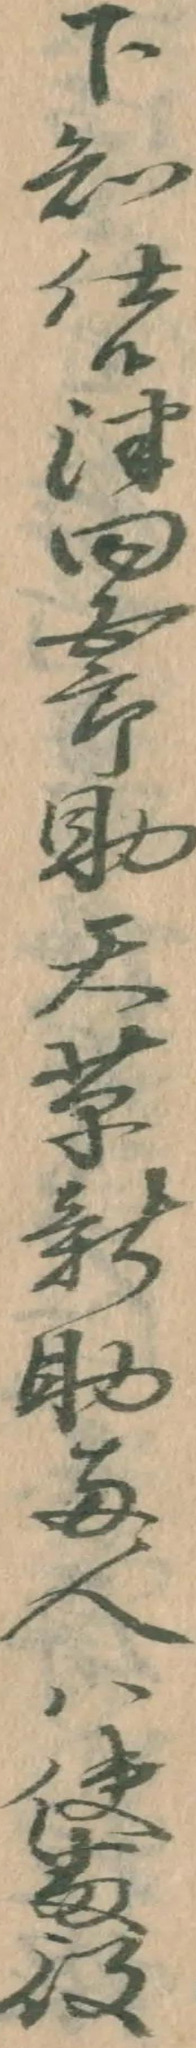下知仕候津田五郎助天草新助両人は使番役
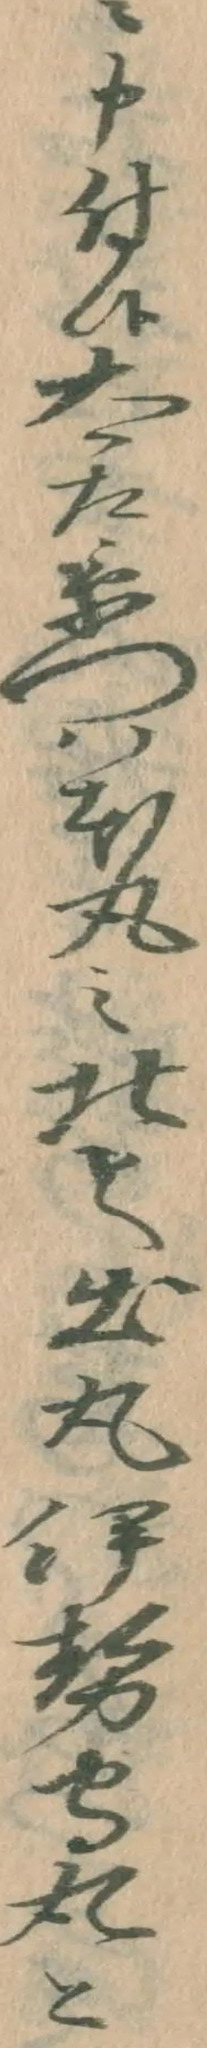に申付候太左衛門は本丸之北と出丸伊勢守丸と

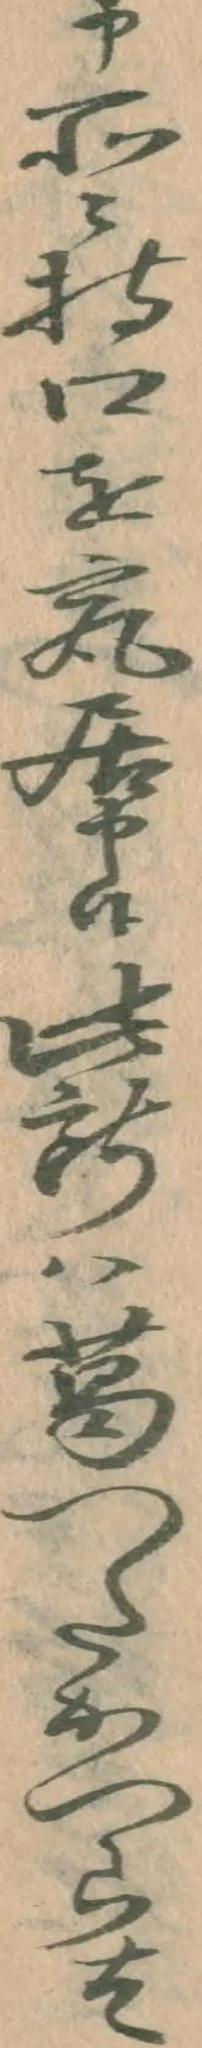申所に持口を究居申候此所は葛つたかつらは
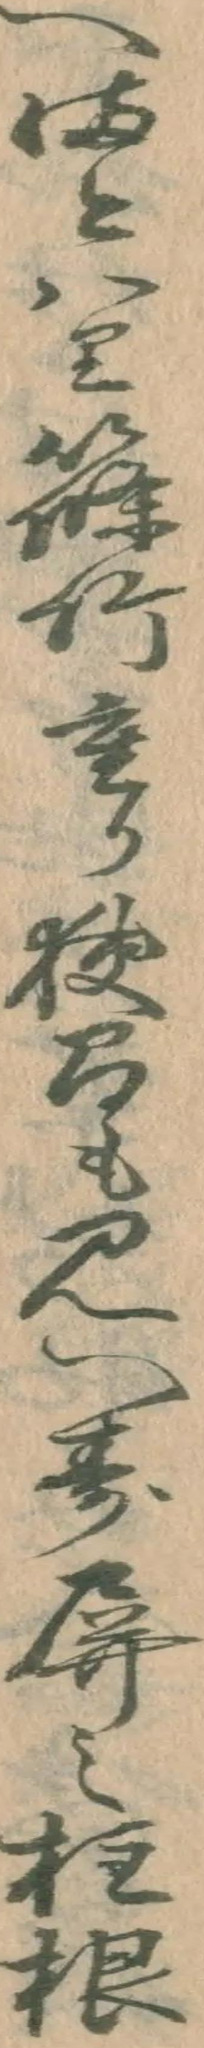へまとはり篠竹重り挟間も見へす屏之柱根
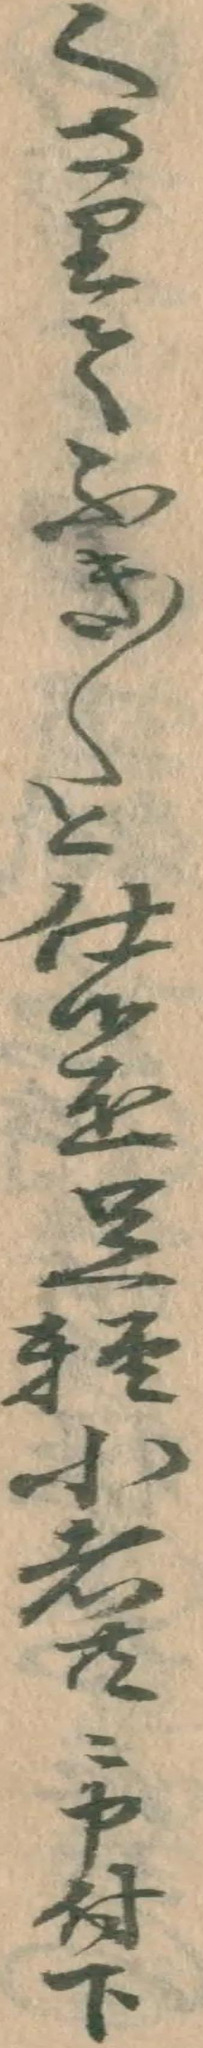くさりてふき〳〵と仕候を足軽小者共に申付下
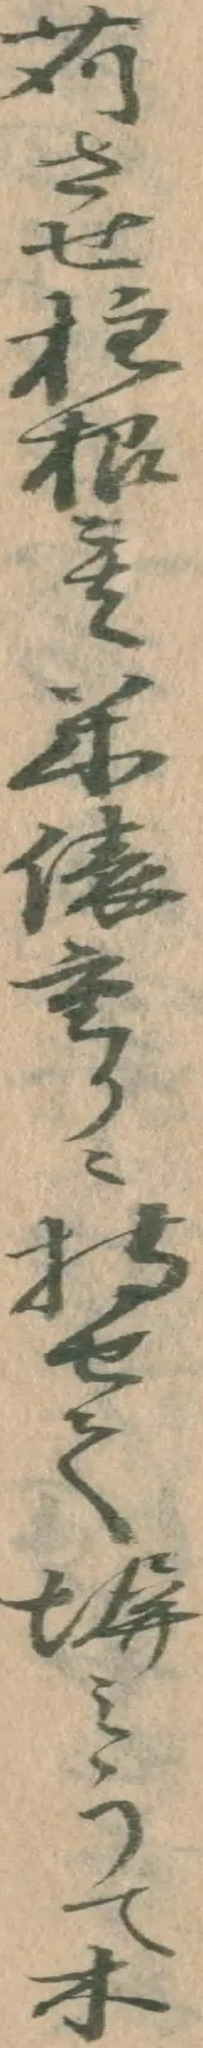苅させ柱根には米俵重りに持せて塀之うて木
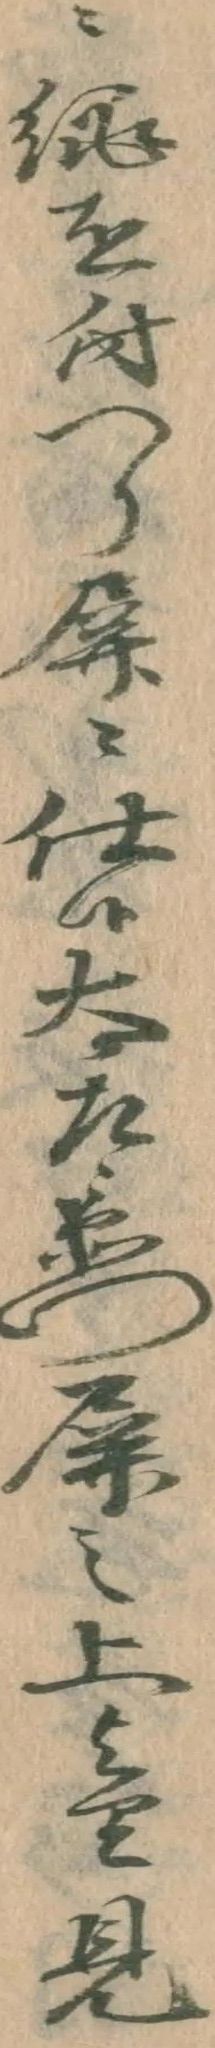に縄を付つり屏に仕候太左衛門屏之上より見
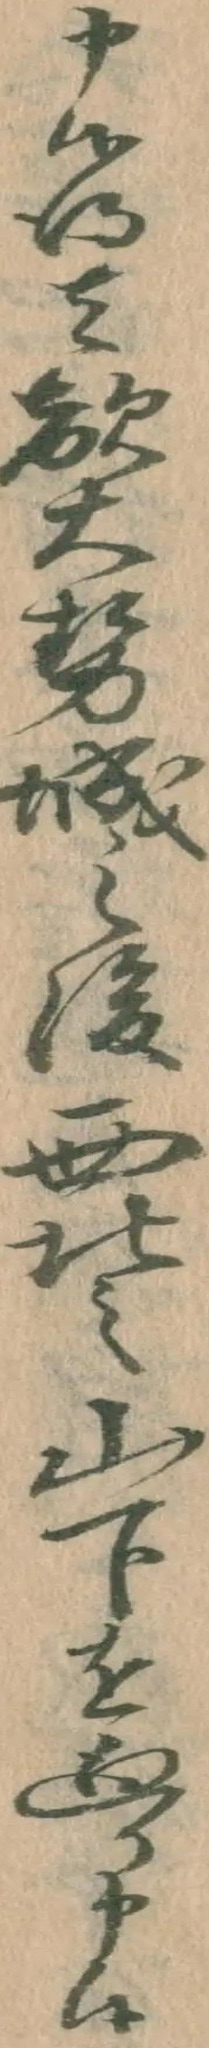申候得は敵大勢城之後西北之山下を廻り申候
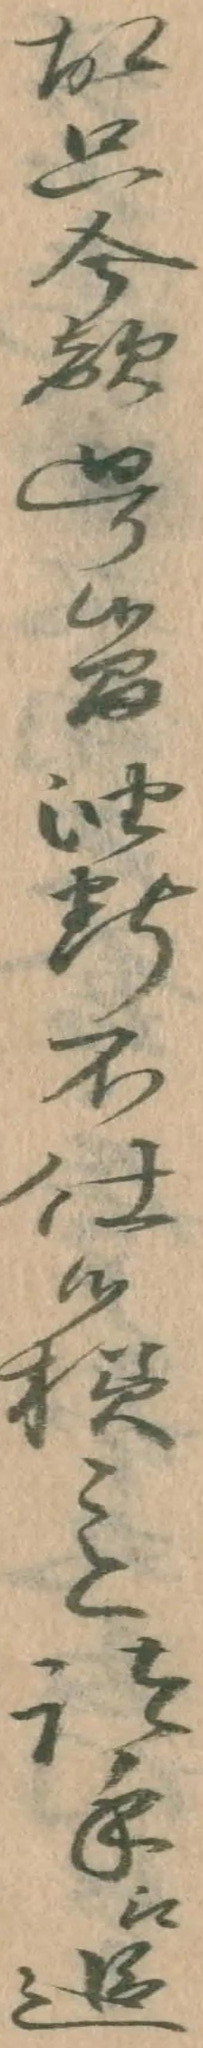故只今敵廻り候間油断不仕候様にと諸手江追
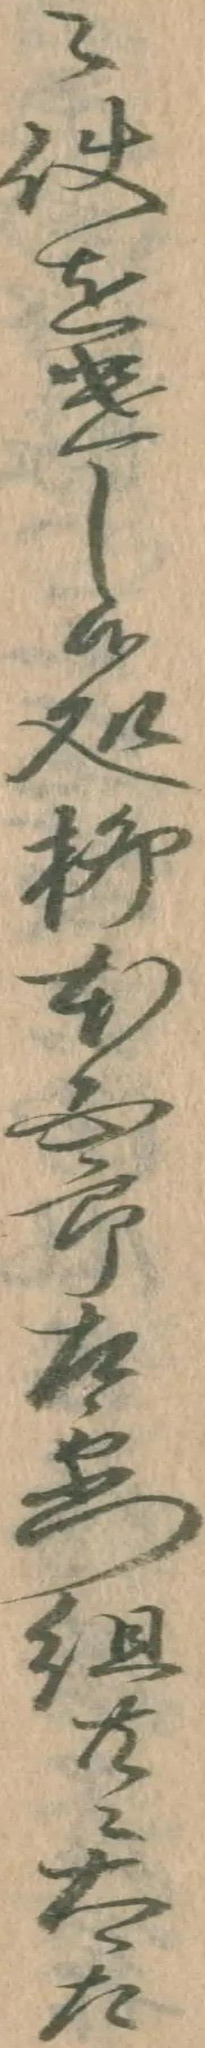之使を遣し候処柳本五郎左衛門組共に太左
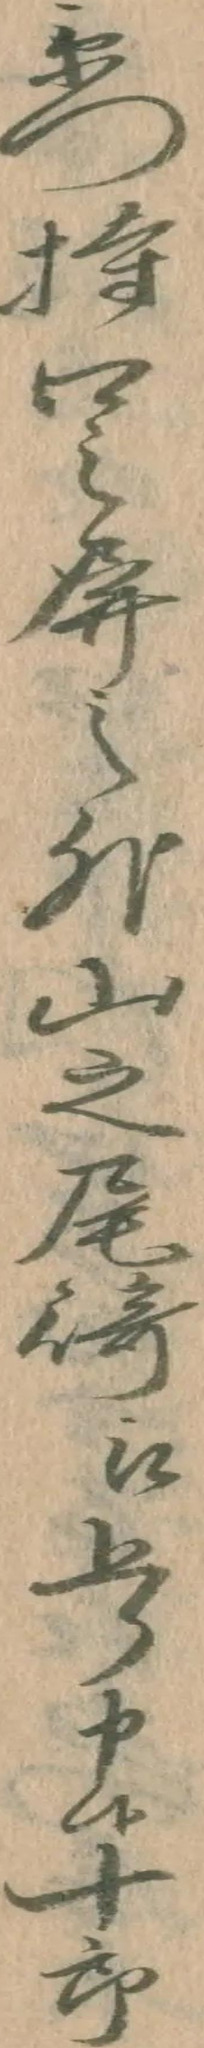衛門持口之屏之外山之尾崎江上り申候十郎
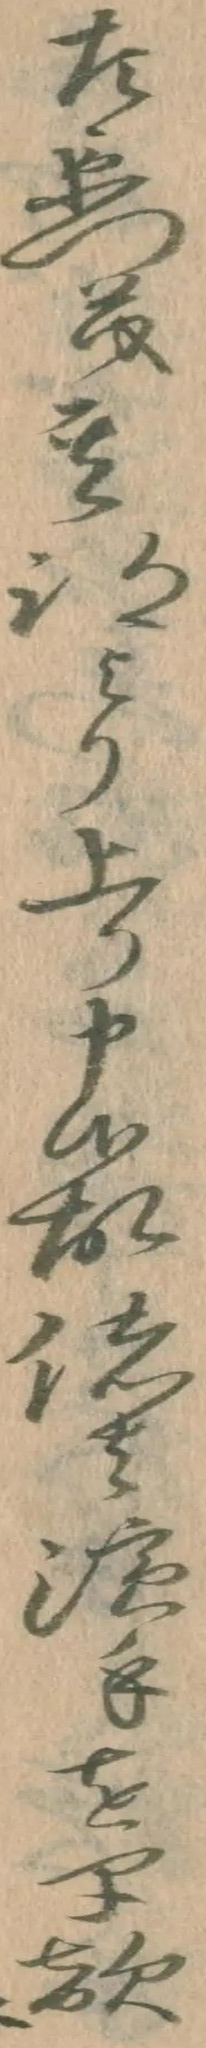左衛門も其跡より上り申候故偖は浜手を早敵に
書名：切支丹御退治記 49巻. [3]
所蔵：国立国会図書館 National Diet Library, JAPAN
